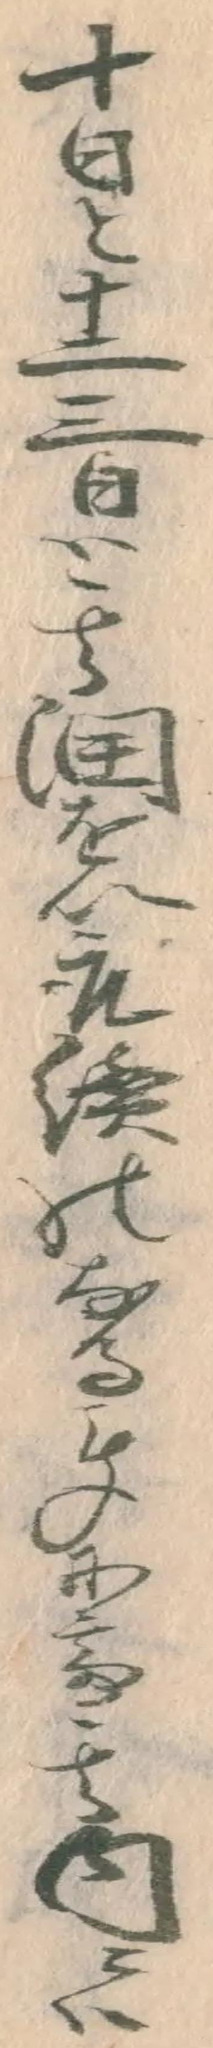十日と十二三日は其潤を以取続のなるものにて其内には
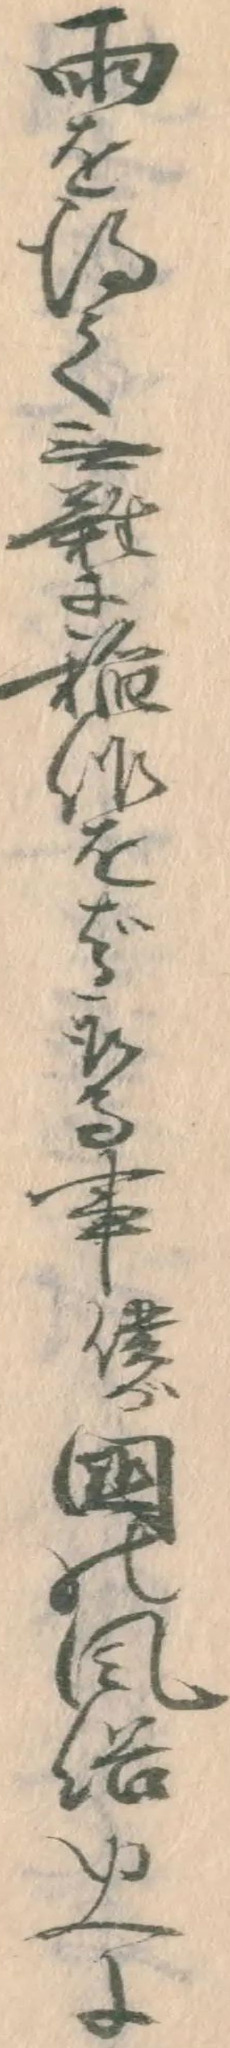雨を得て無難に稲作をば取る事僕か国の風俗ゆへに
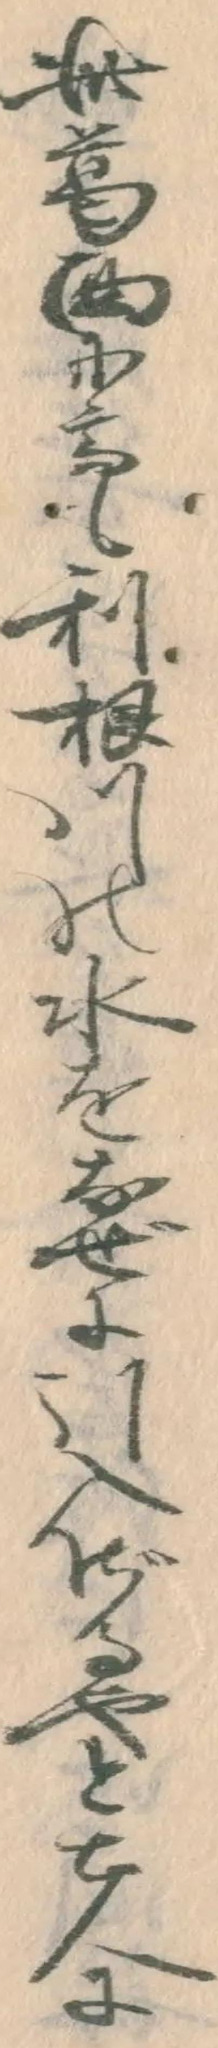此葛西にても利根川の水をなぜに引入ざるやと土人に
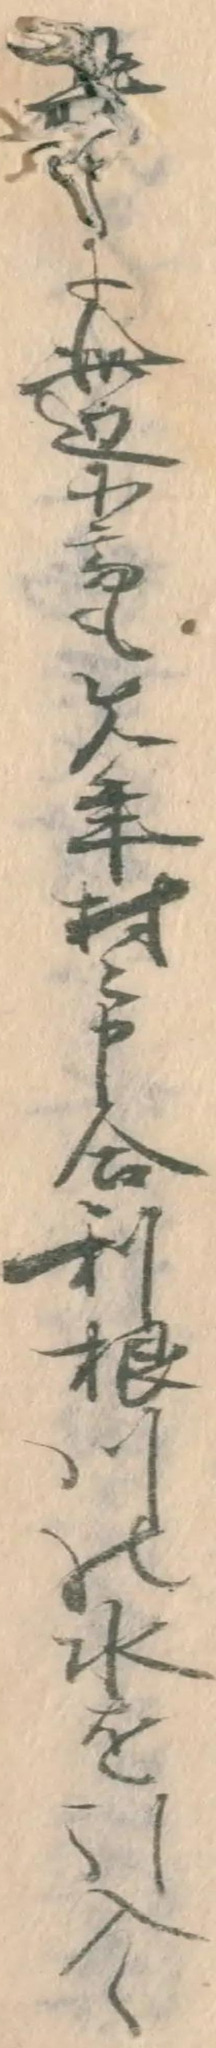に此辺にても先年村々申合利根川の水を引入し

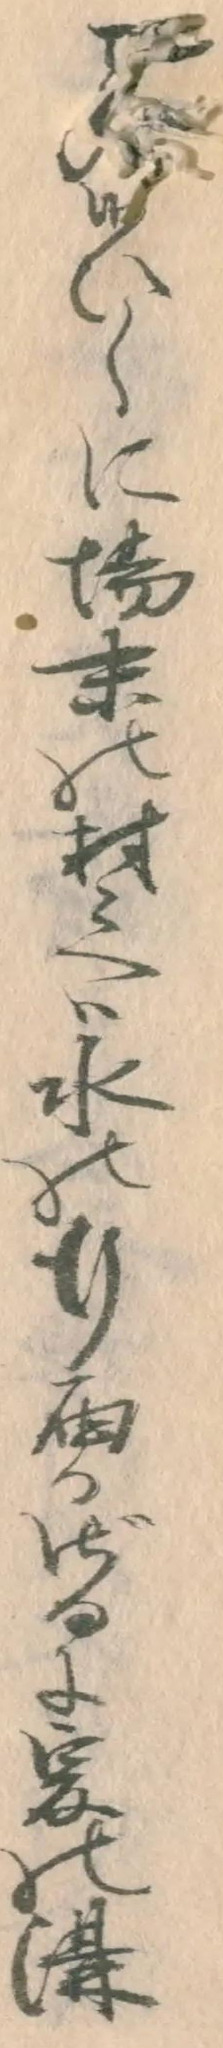ひしに場末の村々へは水の行届かざるに爰の溝
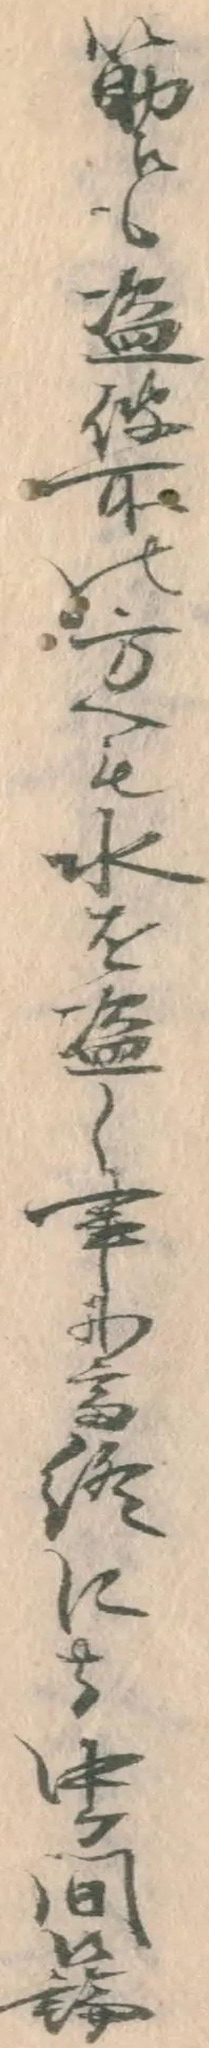筋えも盗彼所の方へも水を盗し事にて終には中か間口論
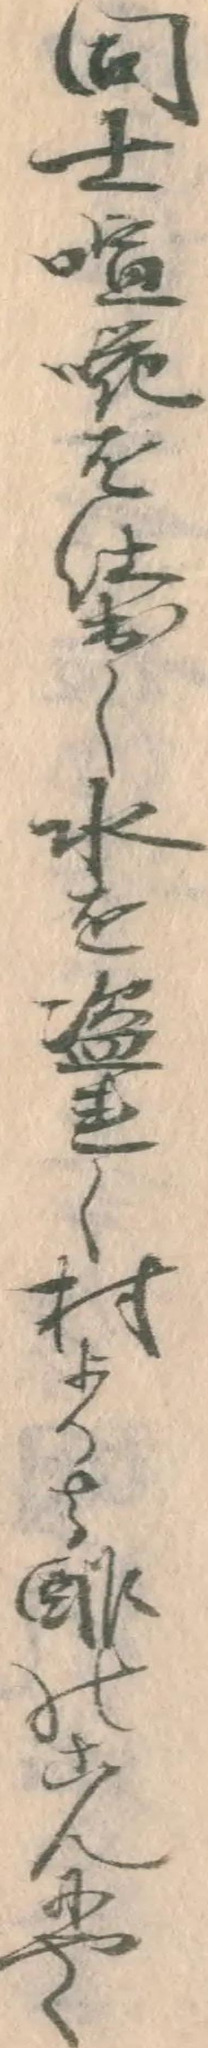同士喧嘩を仕出し水を盗れし村よりは酢のこんにやく
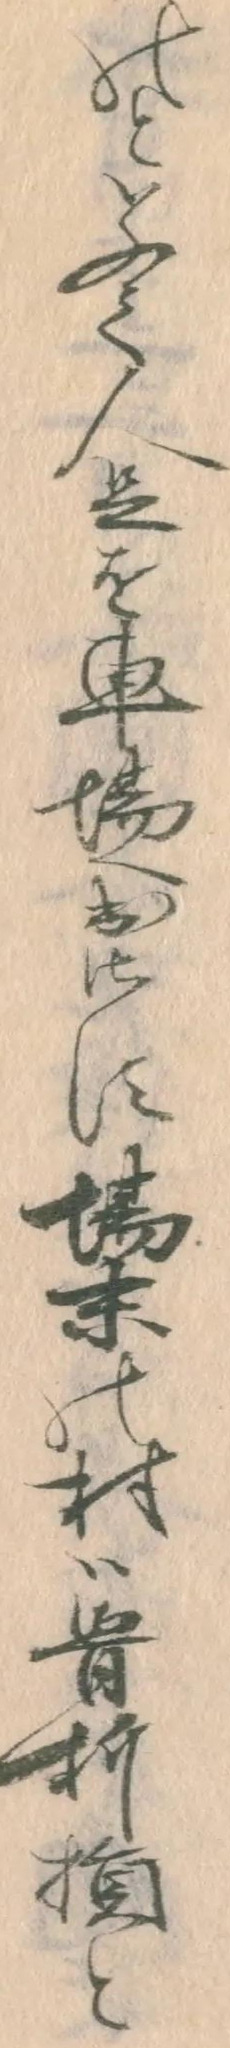のといふて人足を車場へ出さす場末の村は骨科損と
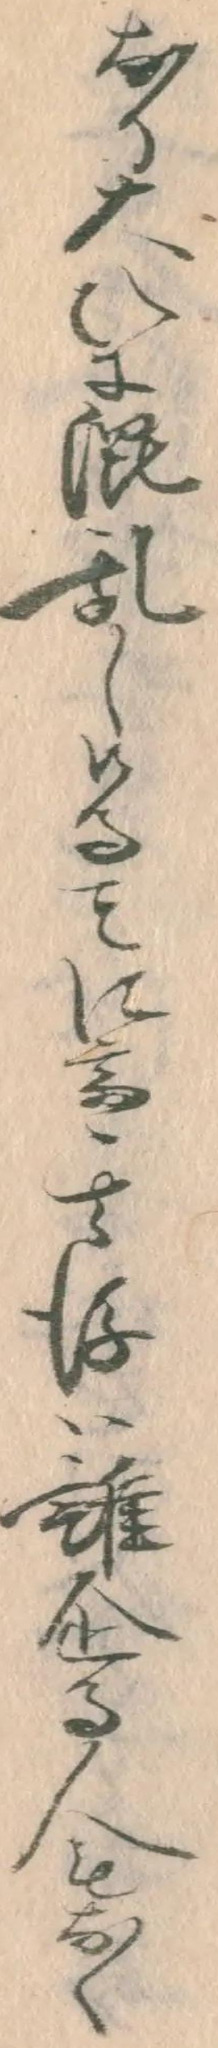なり大ひに混乱しけることにて其後は雑企る人もなく
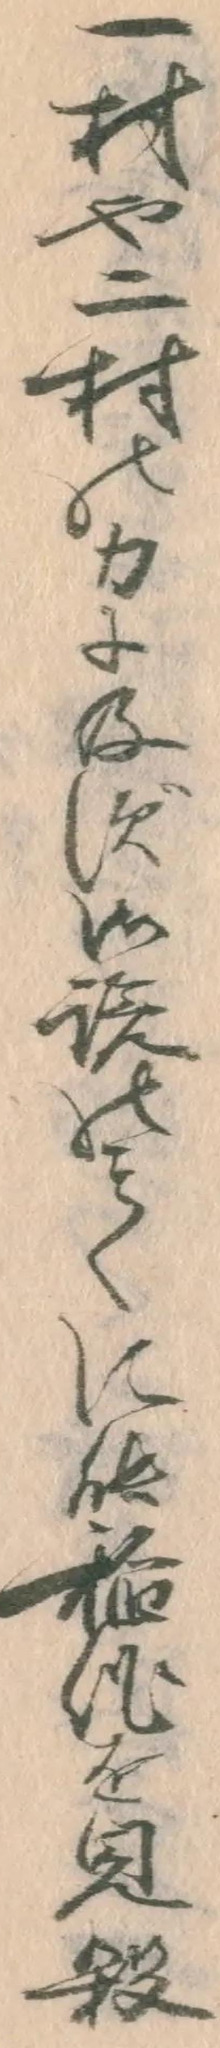一村や二村の力に及ず御覧のことくに能稲作を見殺
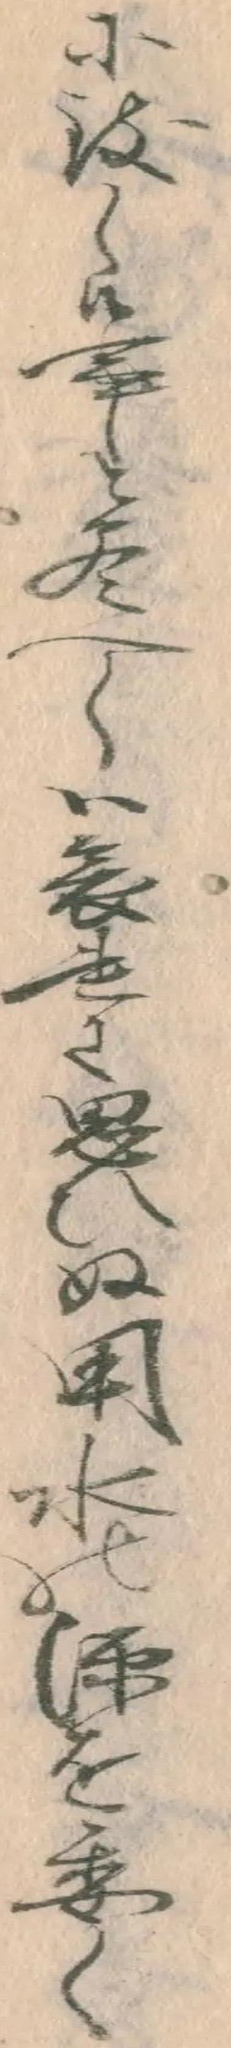に致し候事と尽へくは哀れに思ひぬ用水の源を委く
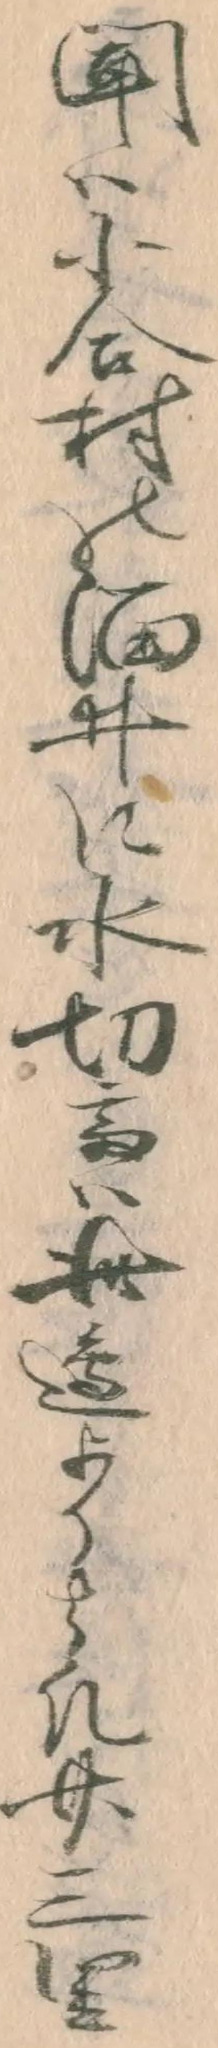聞は小合村の溜井に水切ては此辺よりは凡廿三里
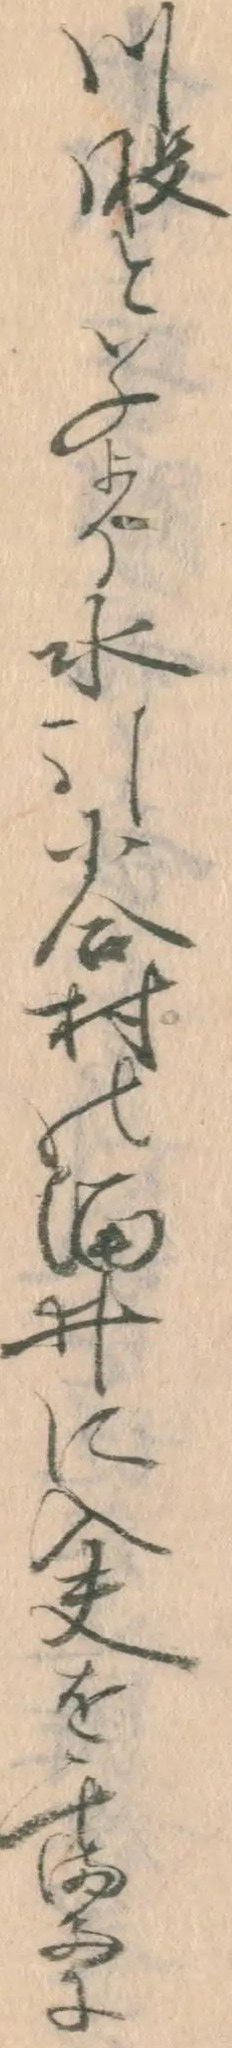川股といふより水引小合村の溜井に入夫を千またに
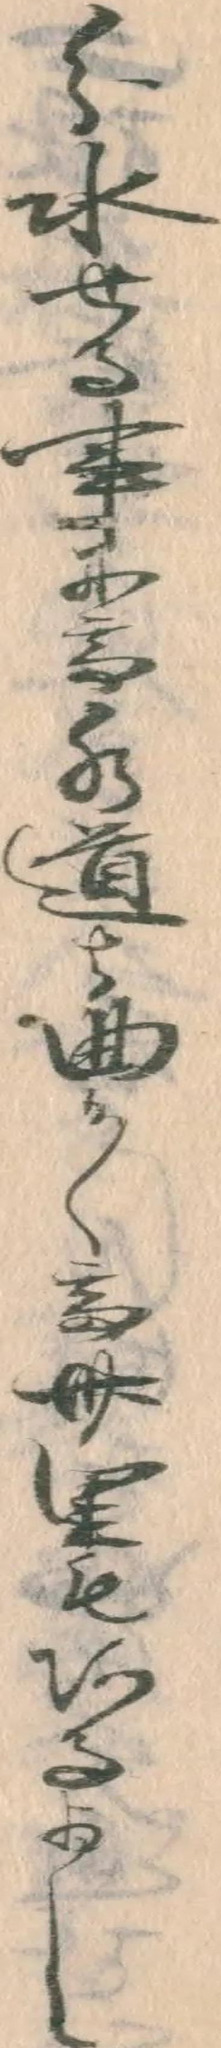分水せる事にて水道は曲り〳〵て廿里もあるよし
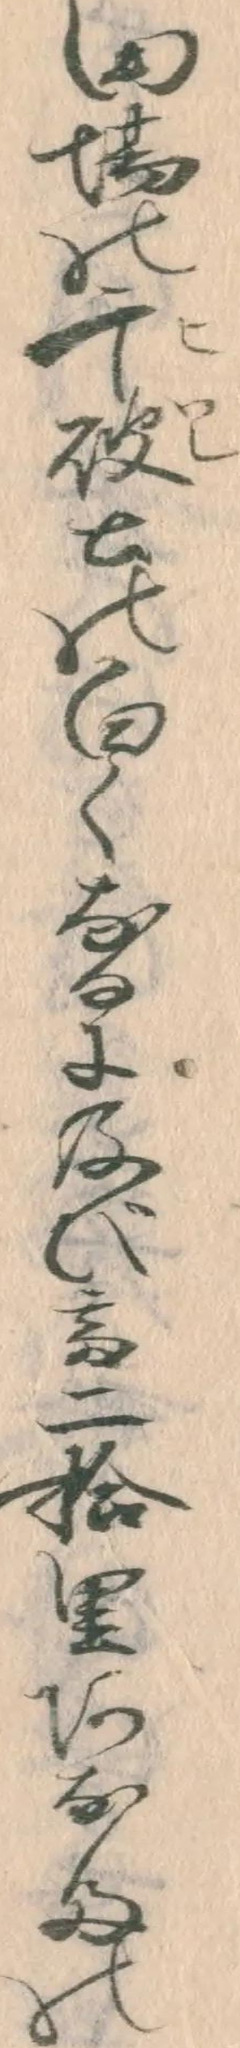田場の干破土の白くなるに及びて二拾里あなたの
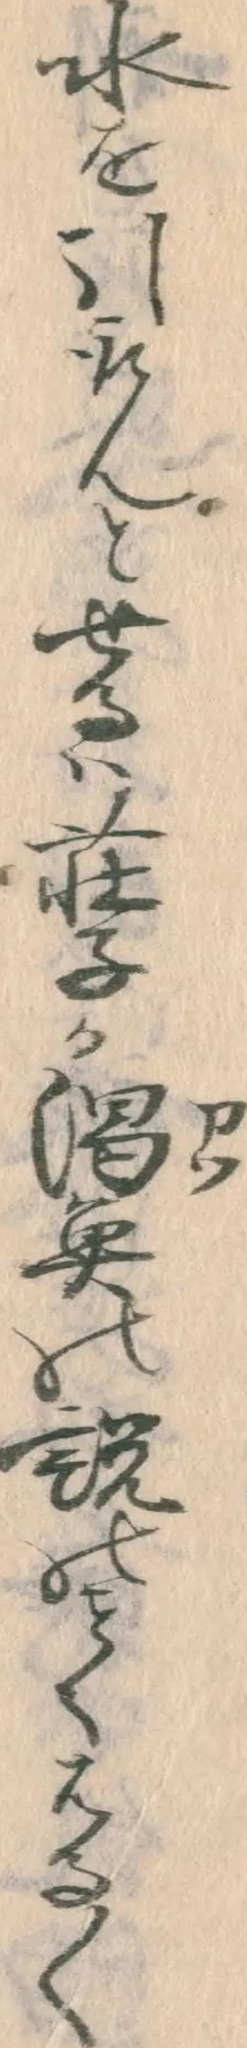水を引取んとせるは荘子か渇魚の説のことくはる〳〵
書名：四神地名録 6巻. [4]葛飾郡
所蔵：国立国会図書館 National Diet Library, JAPAN
